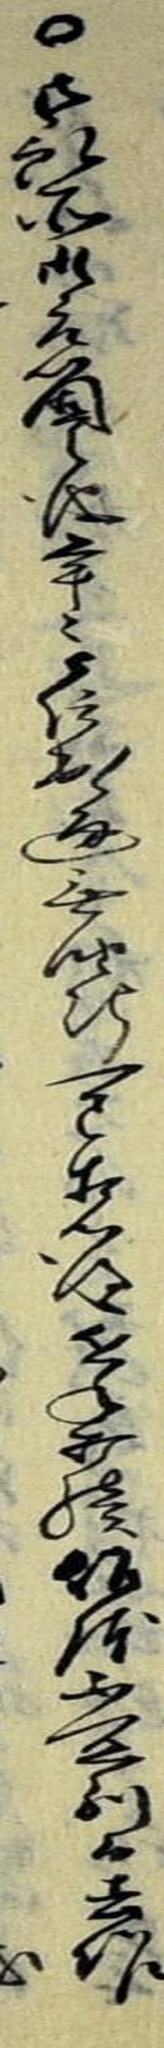〇御預所御取箇之儀年々被仰出候通無油断可被相心得候近年打続作体不宜別而去作
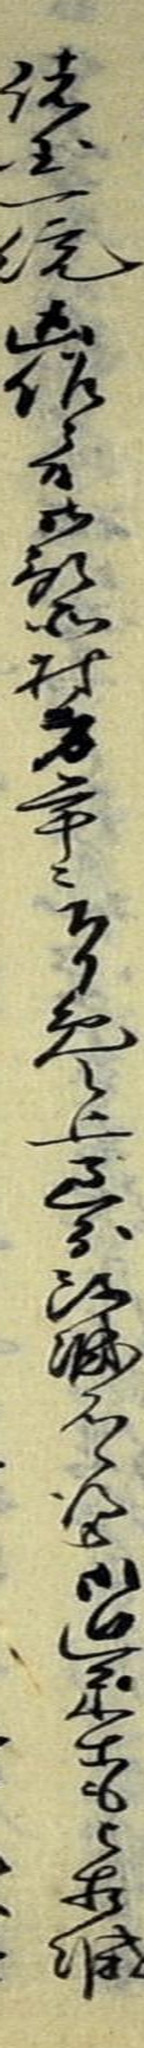諸国一統凶作に付御預所村方年々下り免之上過分致減石候得共御廻米等も被相減
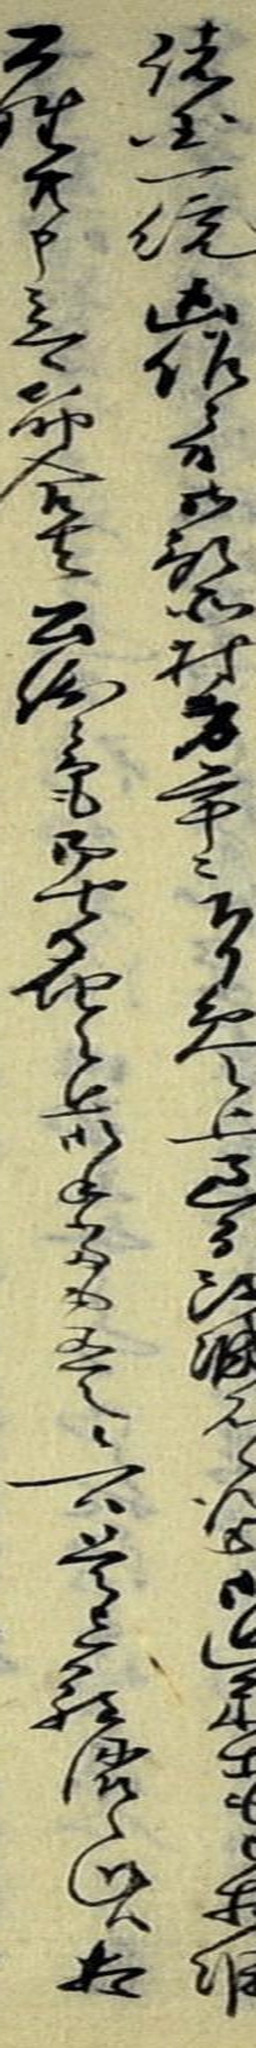百姓共申立候筋合は公儀に而も御聞届之上御手当も有之候へは是迄難渋之趣は相
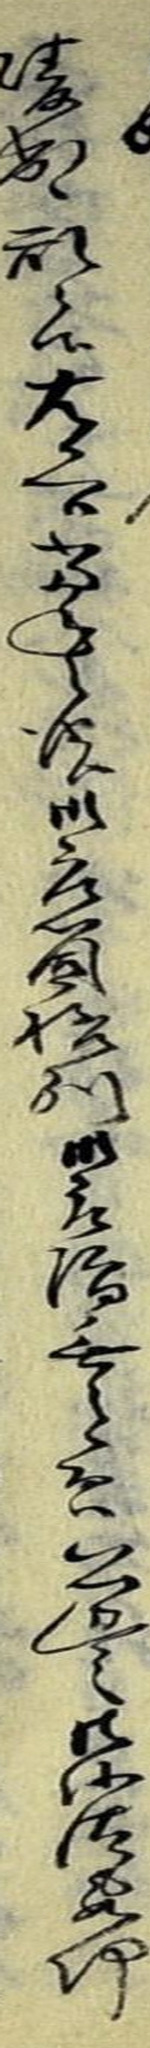凌出候形に候左候へは当年之儀は御取箇格別御取増無之候而は公辺之御沙汰も如何
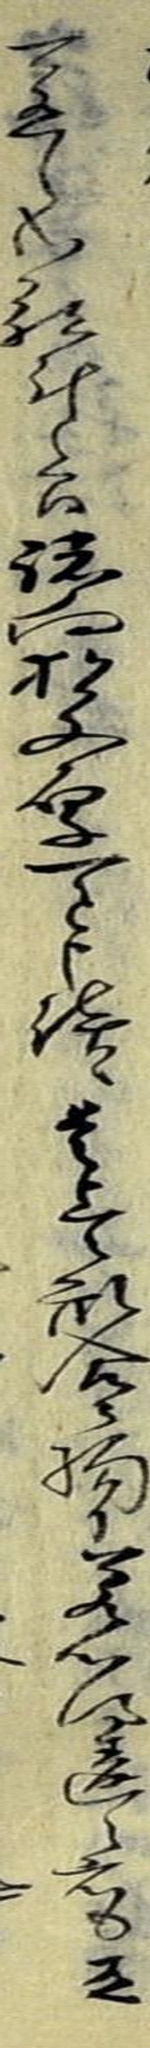可有之哉何難斗候間諸向猶又厚可被申談候是上之形合に拘り若心得違之者も有
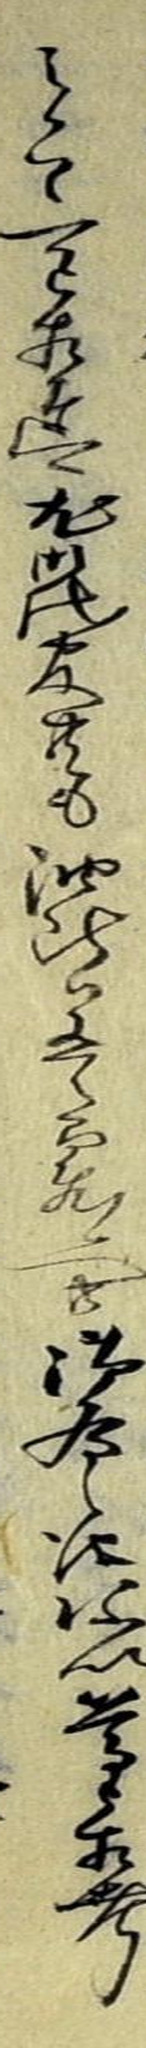之候はゝ可被相達候尤御代官共も油断は有之間敷候へ共御為之儀弥以篤被相考
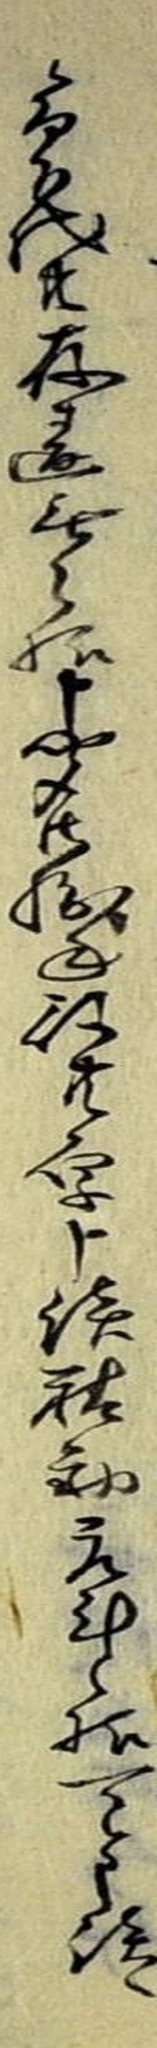候而下代共存違無之様申聞御勝手役共厚申談精勤取斗候様可被申談候
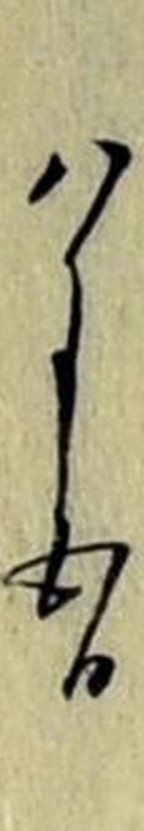八月五日
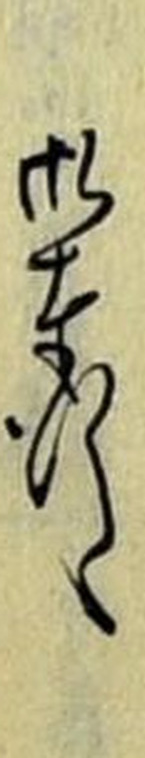御奉行へ
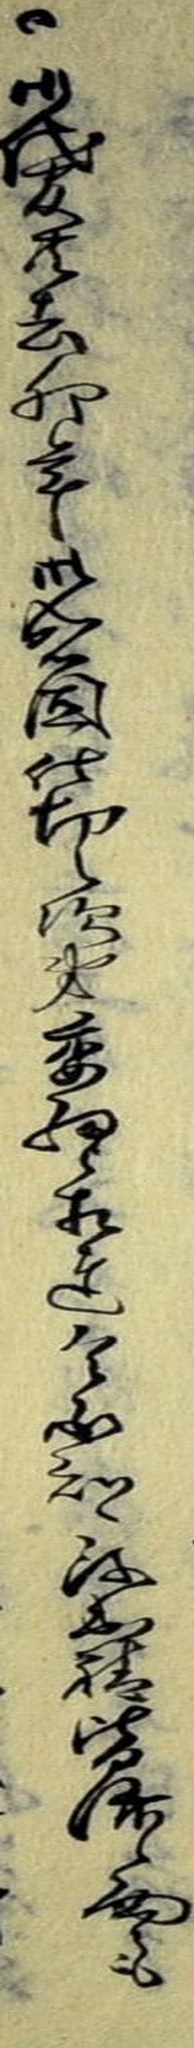〇御代官共去卯年御成箇代切之次第委細被相達令承知候致出精皆済候面々も
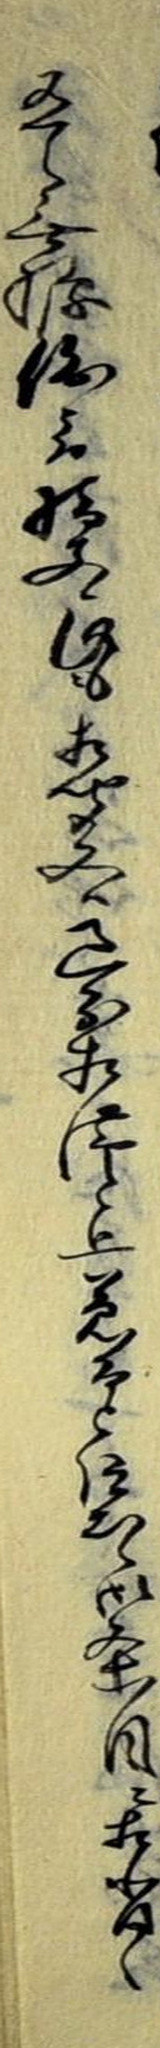有之無拠儀に而指支候趣も相聞又は過分相滞候上兼而被仰出候御条目に相背之

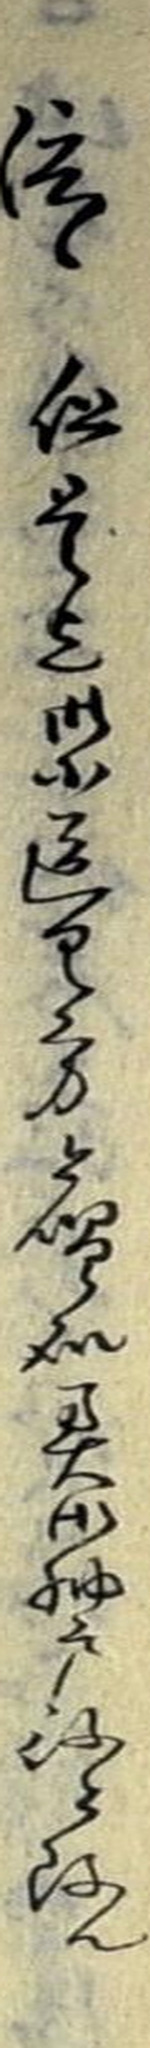渡候但是迄御小道具方と唱候処奥御納戸役と改る
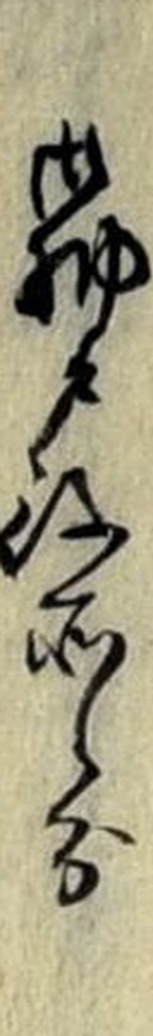御納戸役所之分
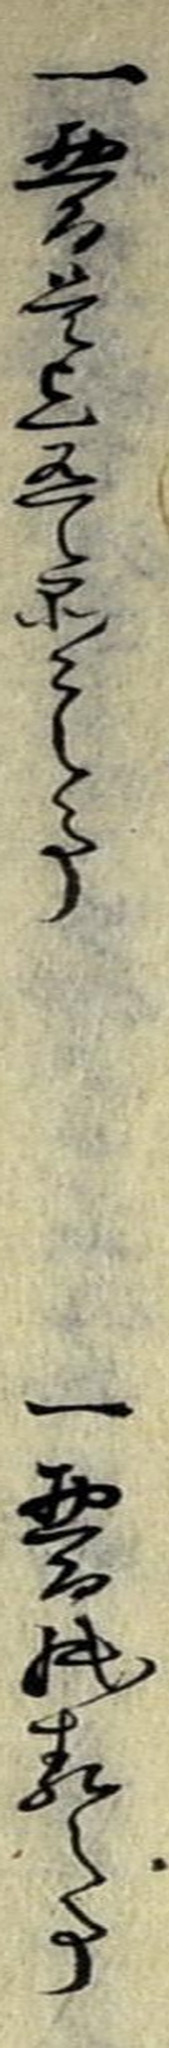一惣而是迄有之品々之事一惣而紙類之事
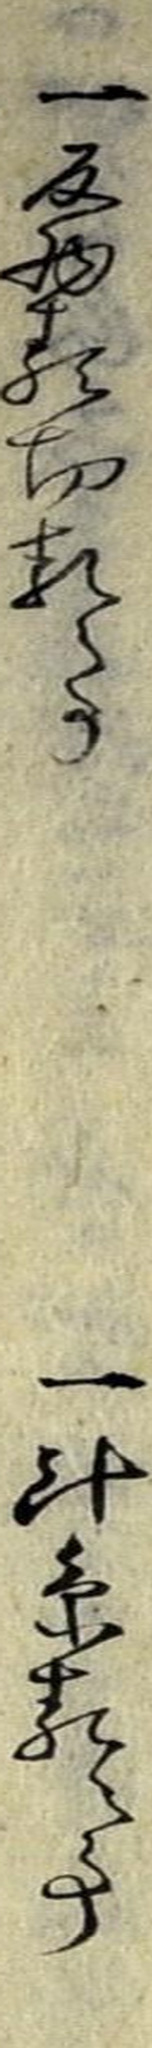一反物類切類之事一針糸類之事
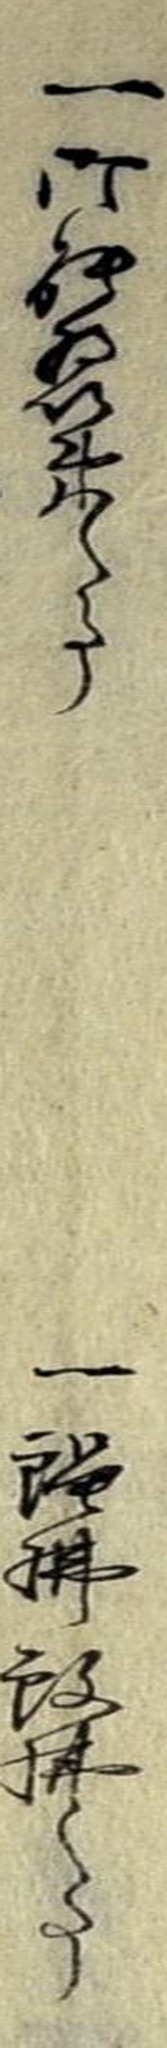一御能装束之事一蝿払蚊払之事
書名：命令之部 二
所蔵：福井県文書館 Fukui Prefectural Archives
